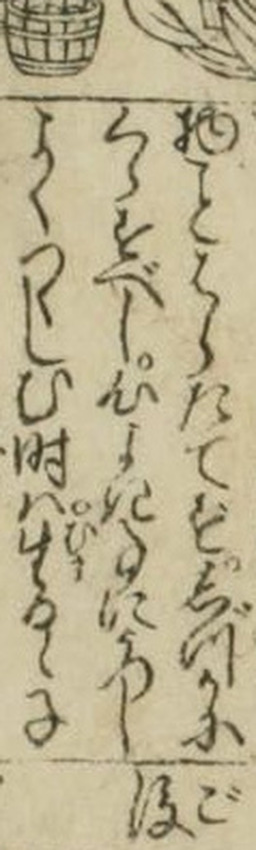くらすべし。心よき事にうつし
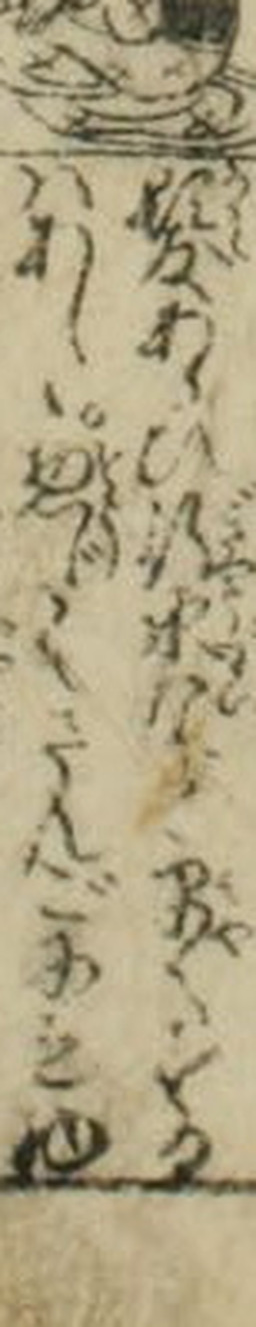はあしゝ。惣じてさんごにも物
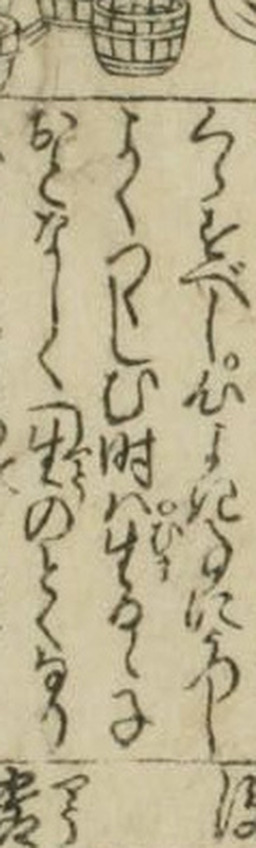よくつゝしむ時は。生るゝ子
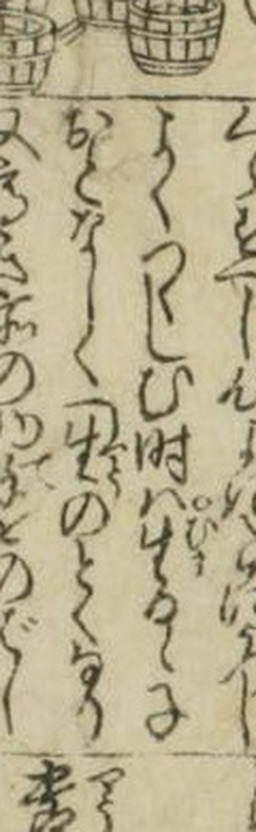よくつゝしむ時は。生るゝ子
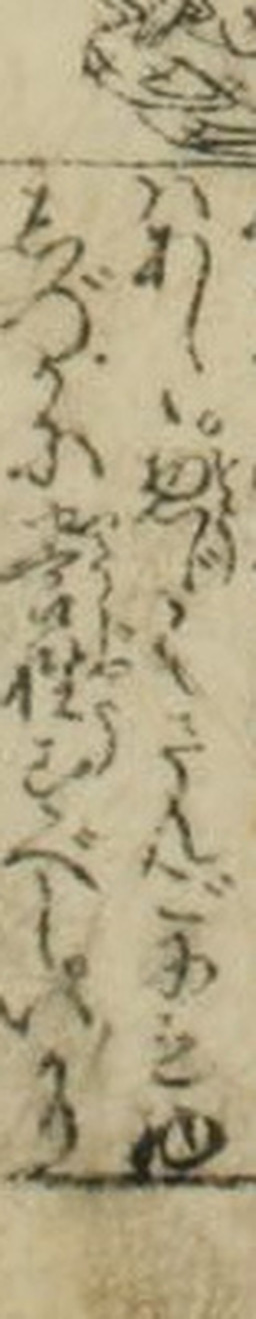しづかに養性すべし。いかり
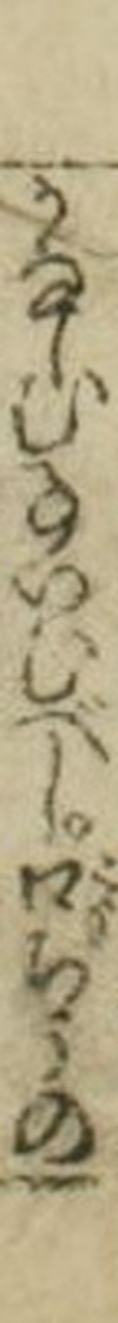かなしむ事いむべし。口ちうの
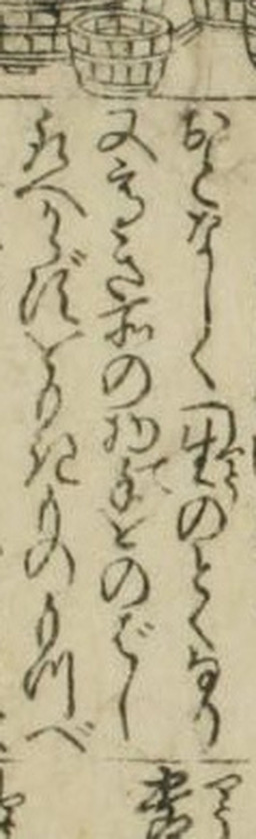又髙き所の物手をのばし
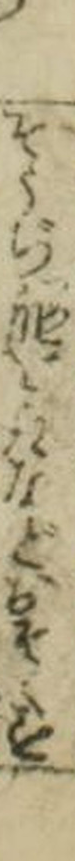そうぢは爪を取などおそくす
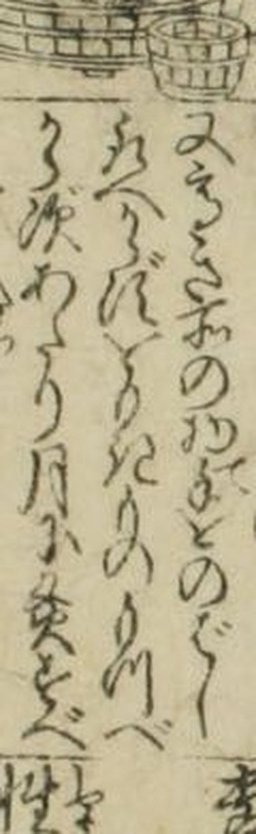取べからず。をもきものもつべ
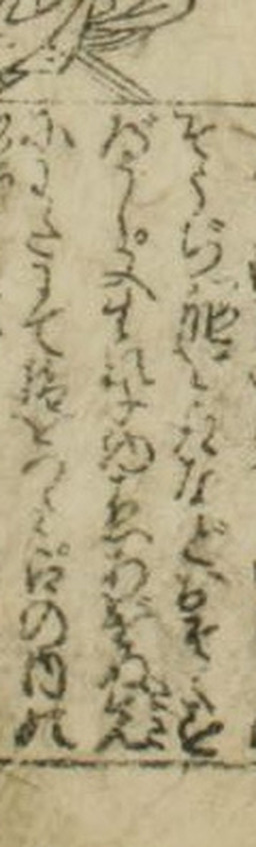べし。又生れ子物こゑあげぬ先
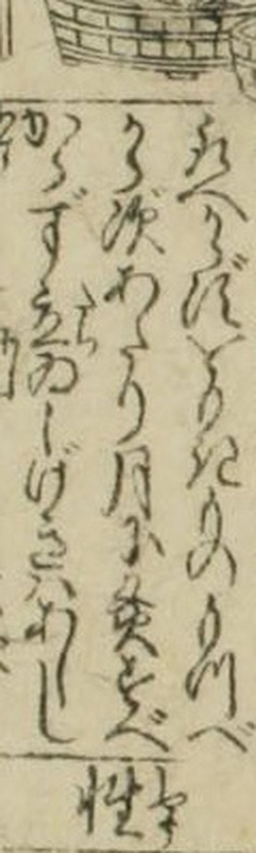からずあたり月に灸すべ
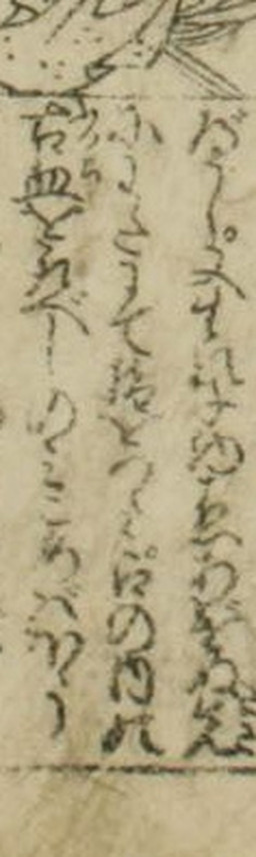にわたにて指をつゝみ。口の内の
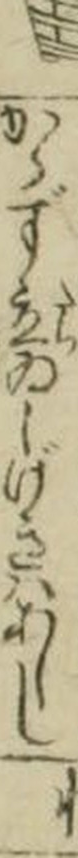からず立ゐしげきはあしし
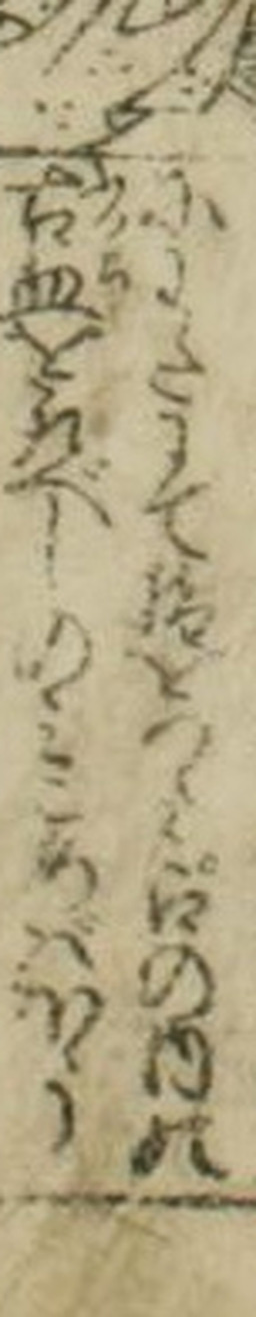古血を取べしのみこめば
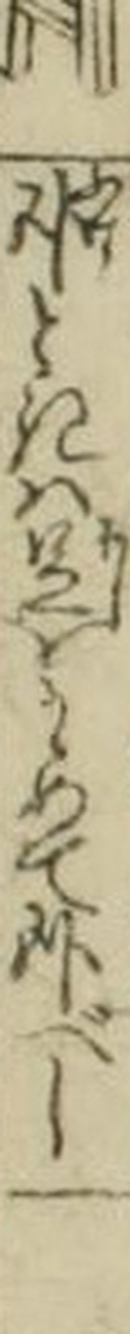臥ときは足をかゝめて臥べし
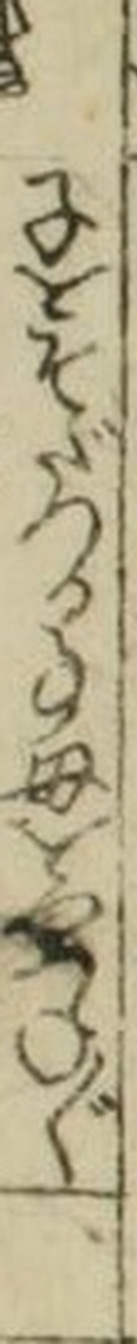子をそだつる事母をやつね〴〵
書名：女源氏教訓鑑
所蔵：東京学芸大学附属図書館
